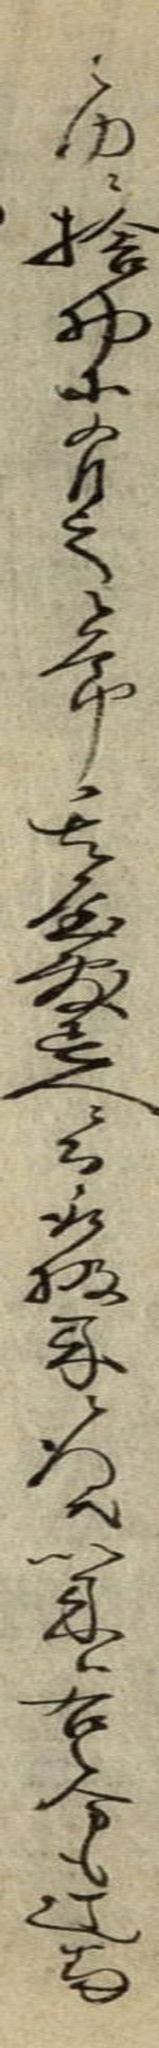之内に捨物等有之候節其屋敷壱人にて取扱来候得共以来は右之分も辻番
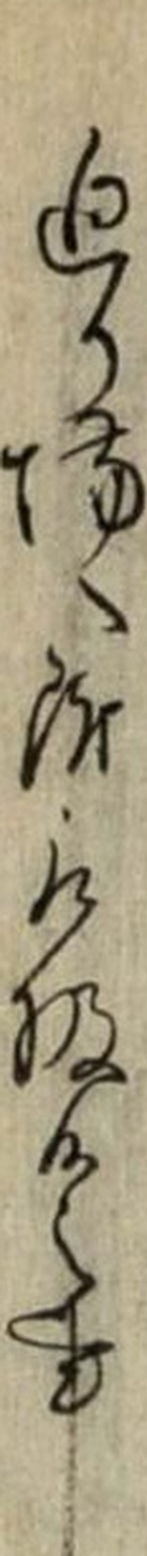廻り場へ附取扱候之事
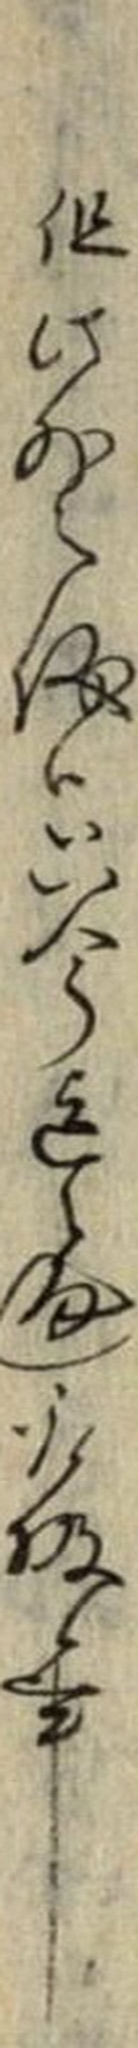但此外之儀は只今迄之通取扱候事
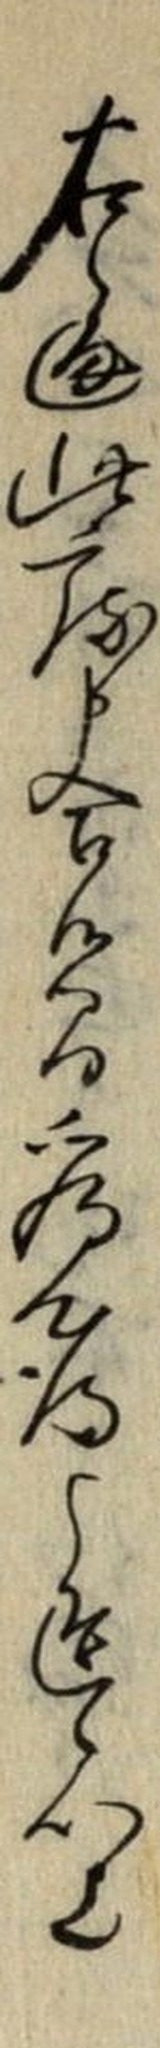右之通此度申合候間為心得申達候以上
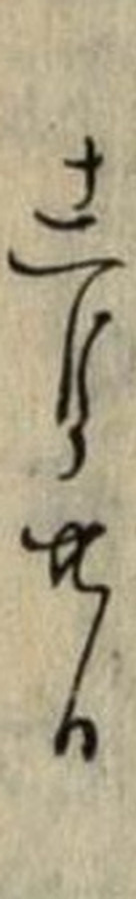十二月廿日
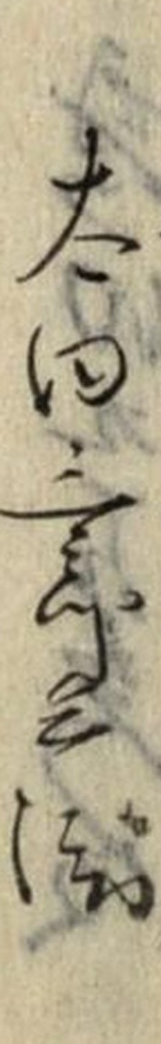太田三郎兵衛
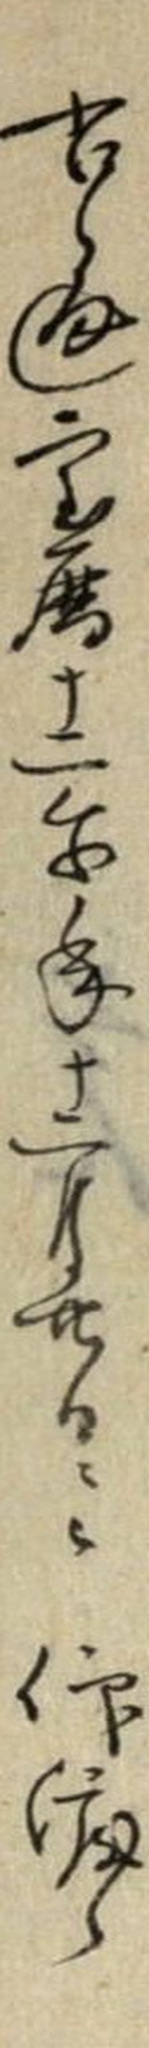右之通宝暦十二午年十二月廿日に被仰渡候
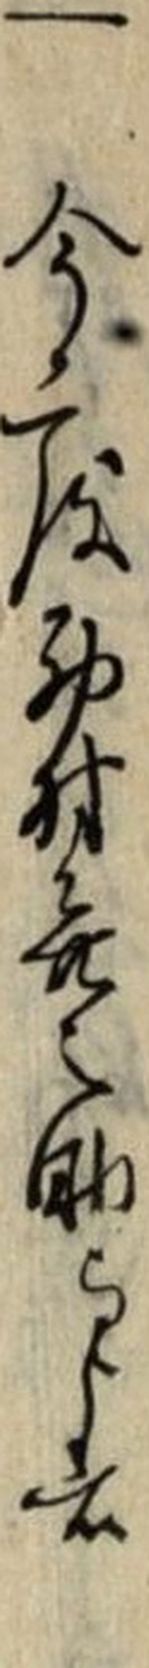一今度西村喜之助と申者
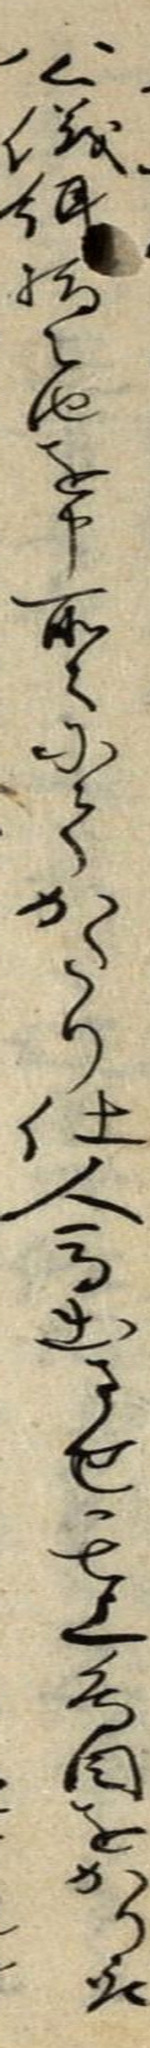公儀餌指之由を申所々にてかたり仕人馬出させ其上鳥目をかり取
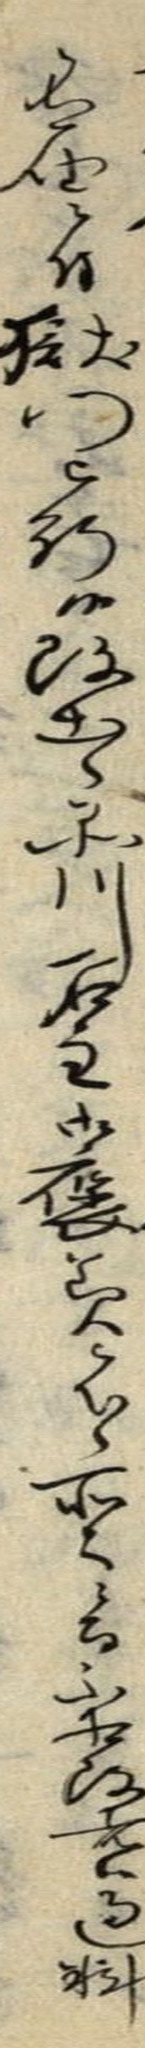不届に付獄門被行候改出候品川名主御褒美被下候所々にて不相改者は過料
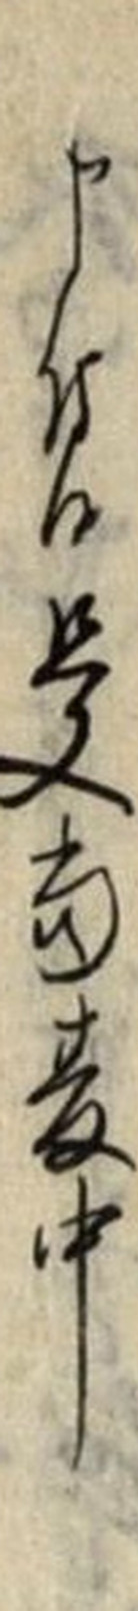申付候且又当夏中
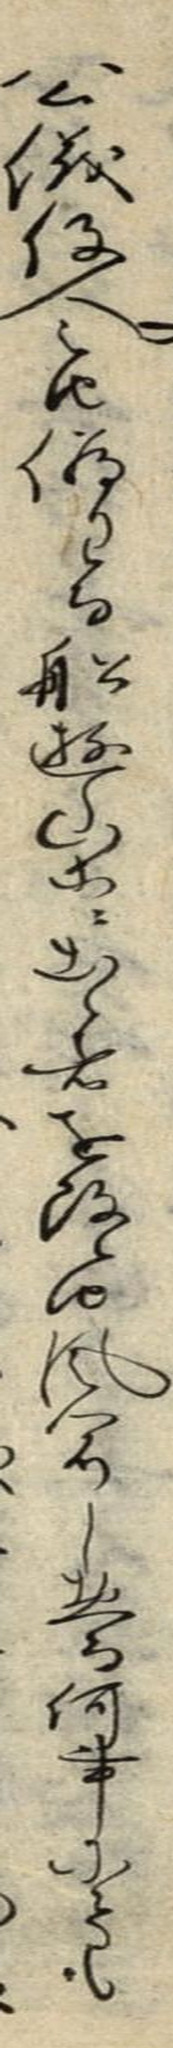公儀役人之由偽り候て船遊山等に出候者を改候由風聞候惣て何事にても
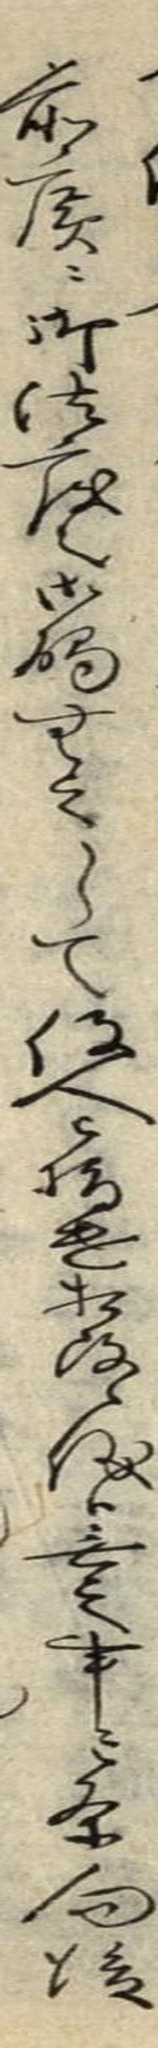前広に御法度之御触無之して役人被指遣相改候儀は無之事に候条向後
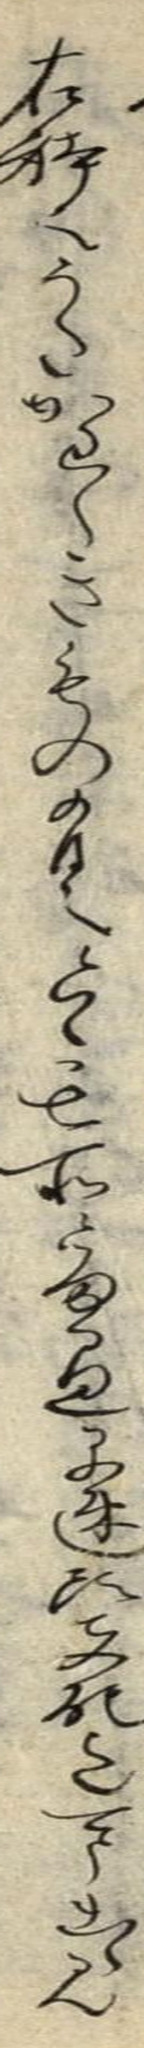右体之うたかわしきもの有之候はゝ其所に留置早速頭支配迄可申出候見
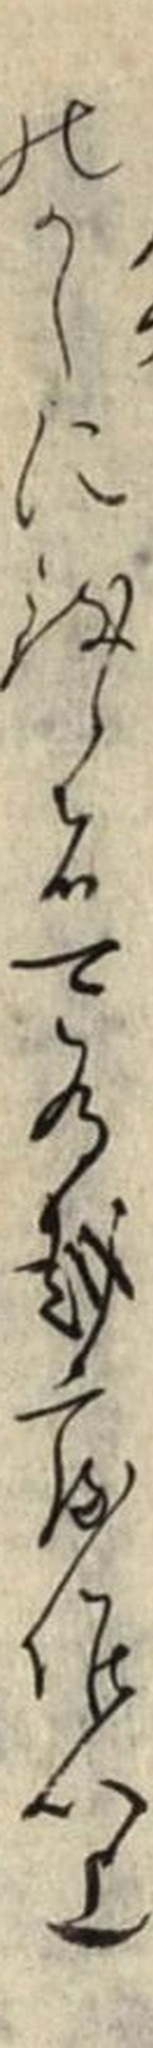のかしに致候者可為越度候以上
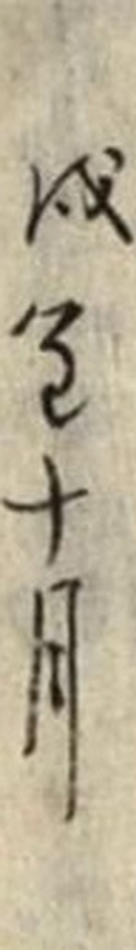戌閏十月
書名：三都并道中之部
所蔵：福井県文書館 Fukui Prefectural Archives
